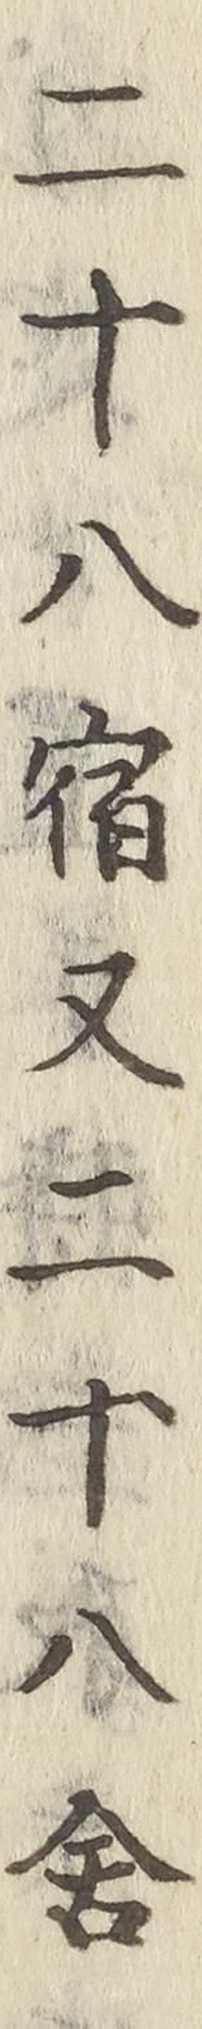二十八宿又二十八舎
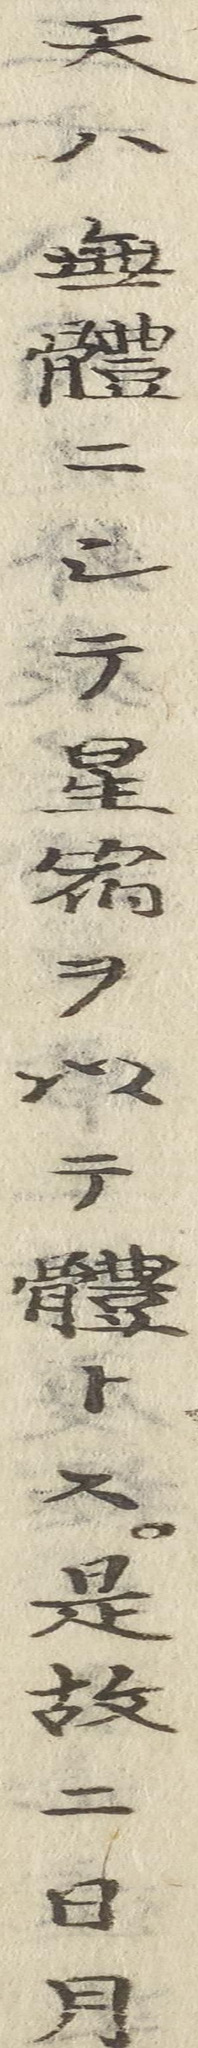天ハ無体ニシテ星宿ヲ以テ体トス。是故ニ日月
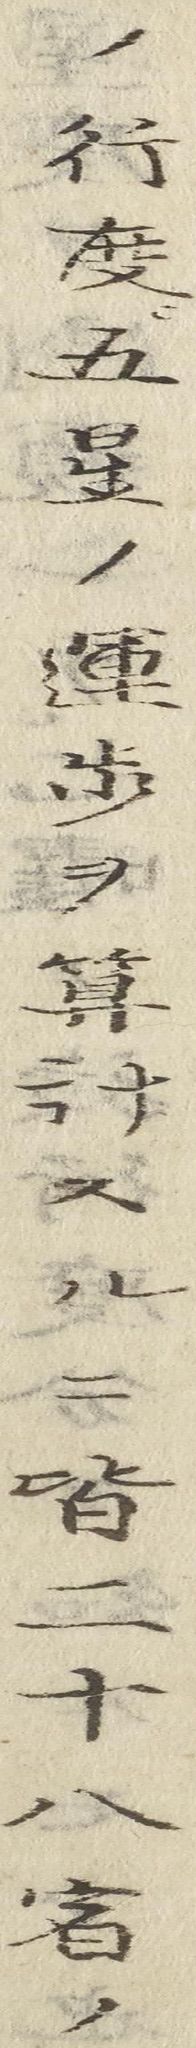ノ行度。五星ノ運歩ヲ算計スルニ皆二十八宿ノ

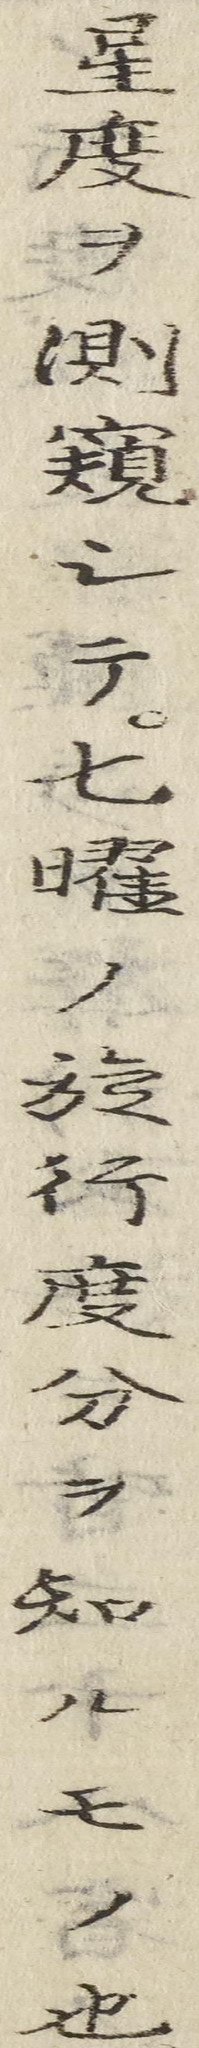星度ヲ測窺シテ。七曜ノ旋行度分ヲ知ルモノ也。
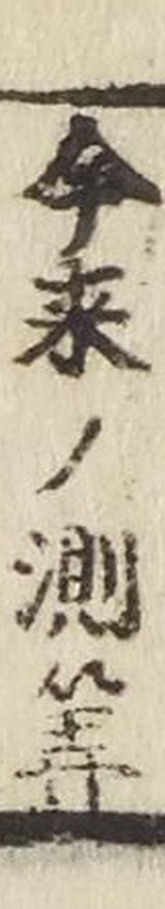今来ノ測等
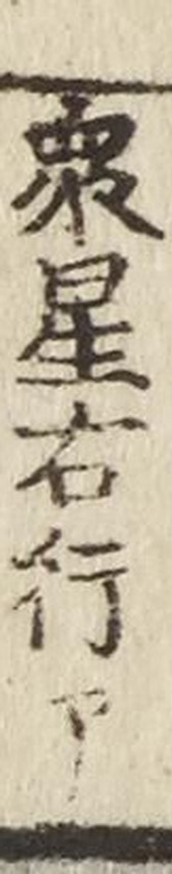衆星右行ア
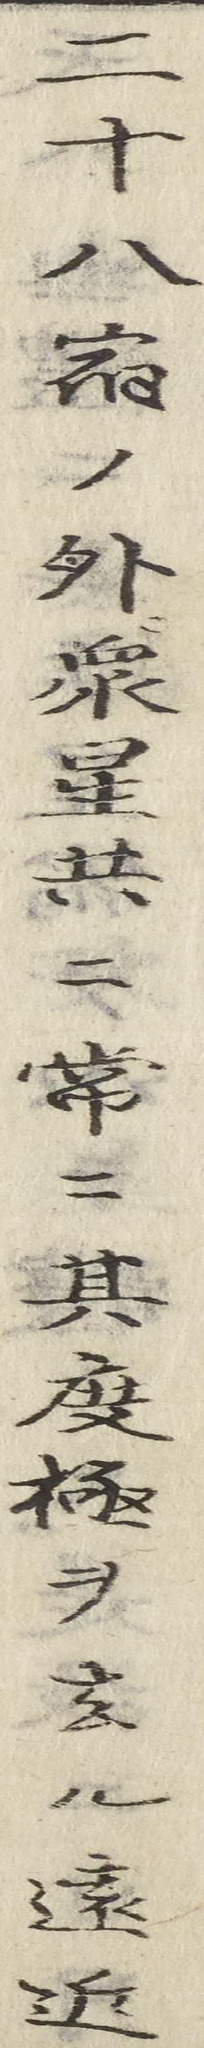二十八宿ノ外衆星共ニ常ニ其度極ヲ去ル遠近
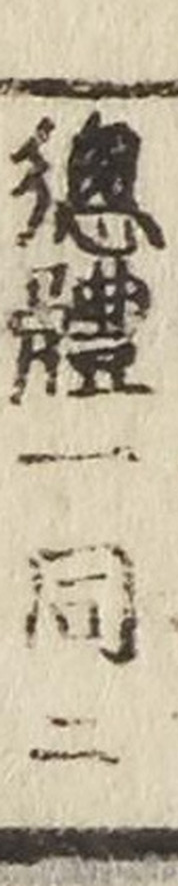総体一同ニ
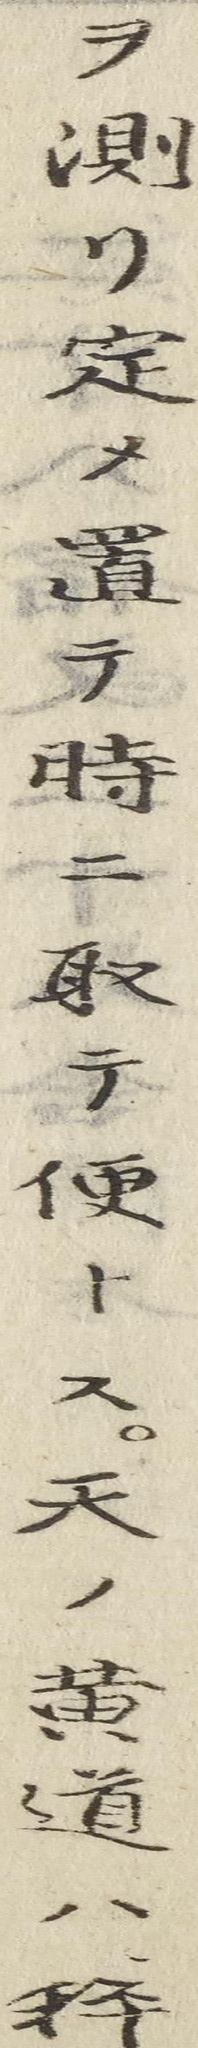ヲ測リ定メ置テ時ニ取テ便トス。天ノ黄道ハ秤
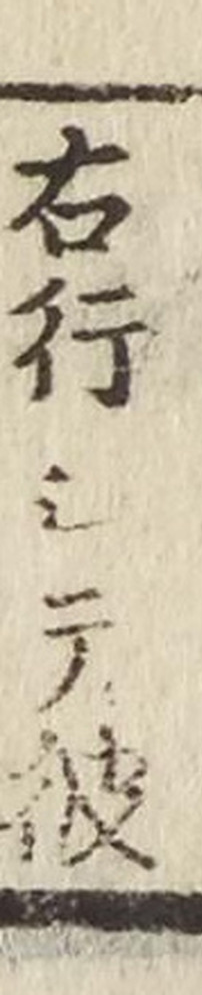右行シテ彼
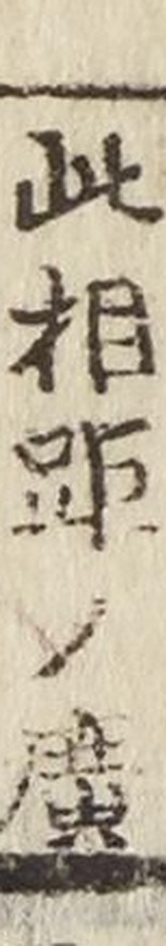此相距ノ広
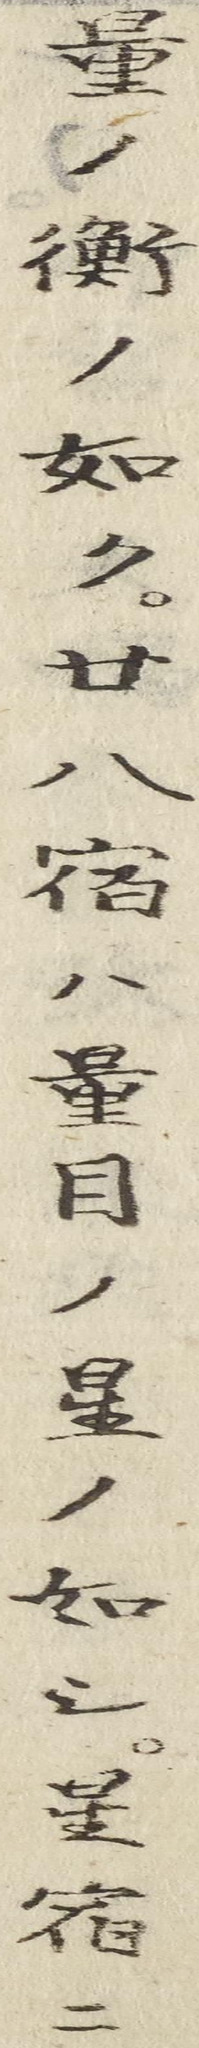量ノ衡ノ如ク。二十八宿ハ量目ノ星ノ如シ。星宿ニ
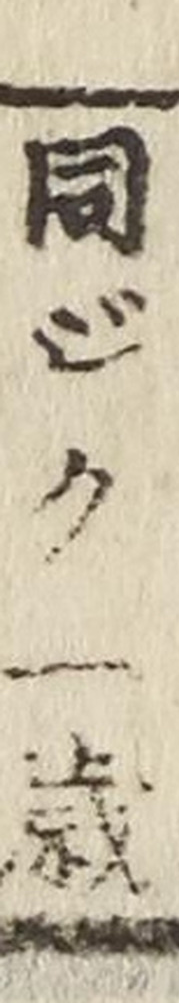同ジク一歳
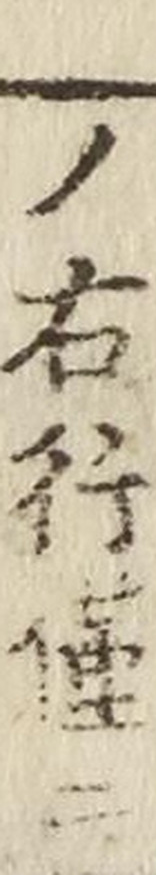ノ右行僅ニ
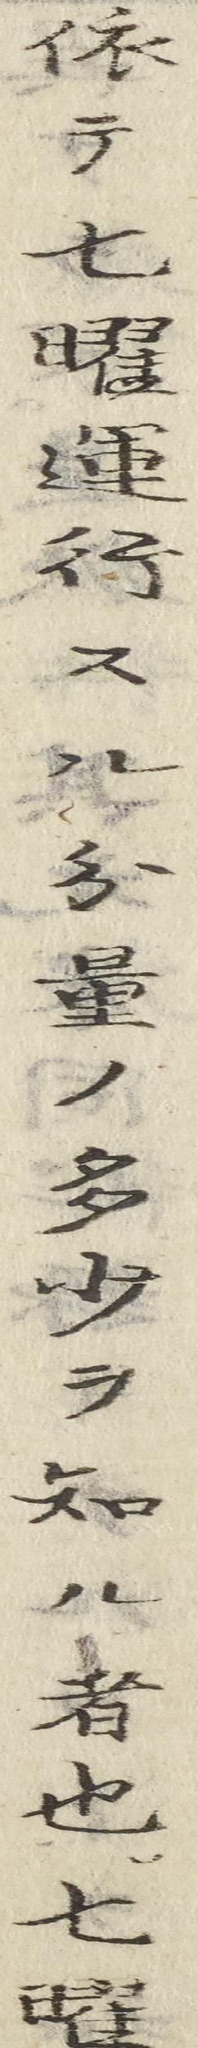依テ七曜運行スル分量ノ多少ヲ知ル者也。七曜
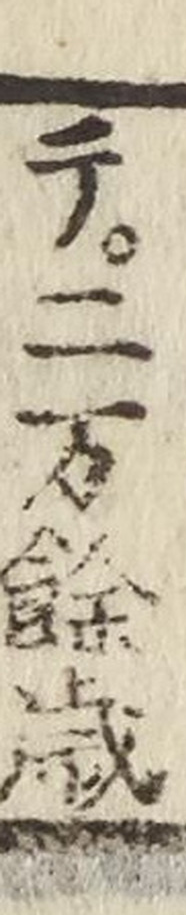テ。二万余歳
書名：大略天学名目鈔　天經或問附録
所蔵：東京大学地震研究所図書室 Earthquake Research Institute Library, The University of Tokyo, JAPAN
